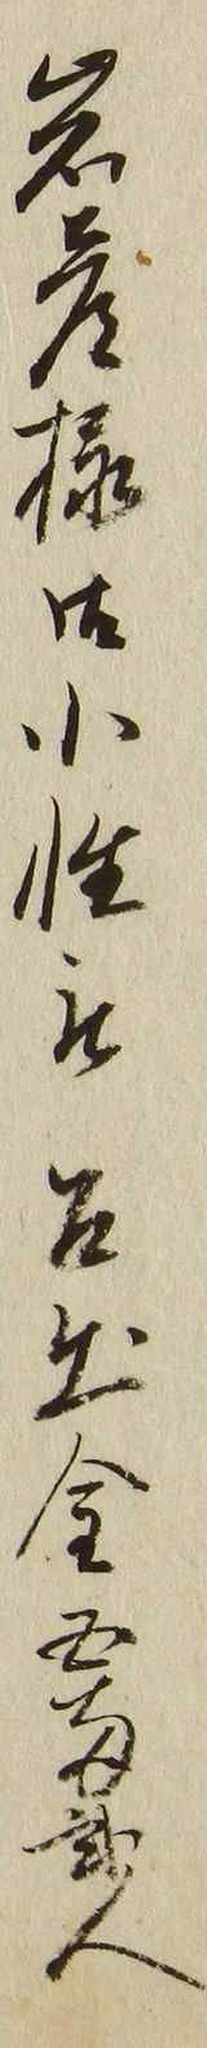岩彦様御小性被召出金五両弐人
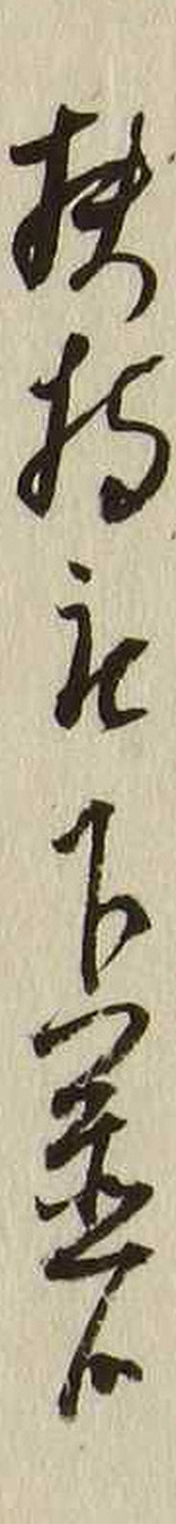扶持被下置候
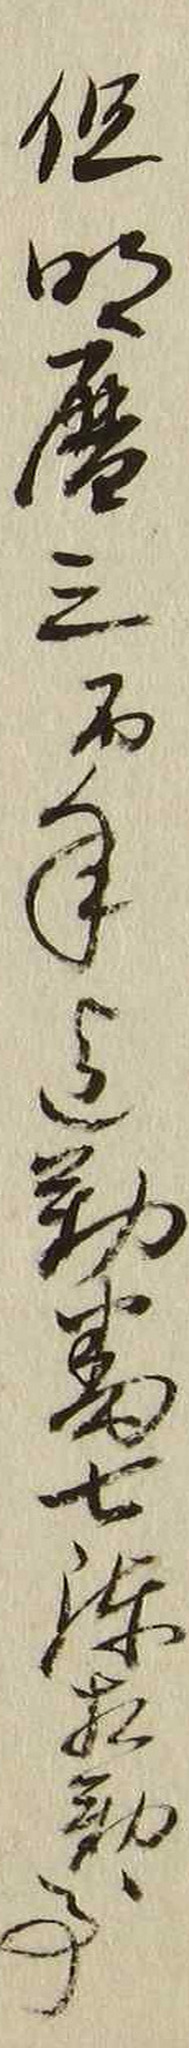但明暦三酉年迄勤番七陣相勤候事
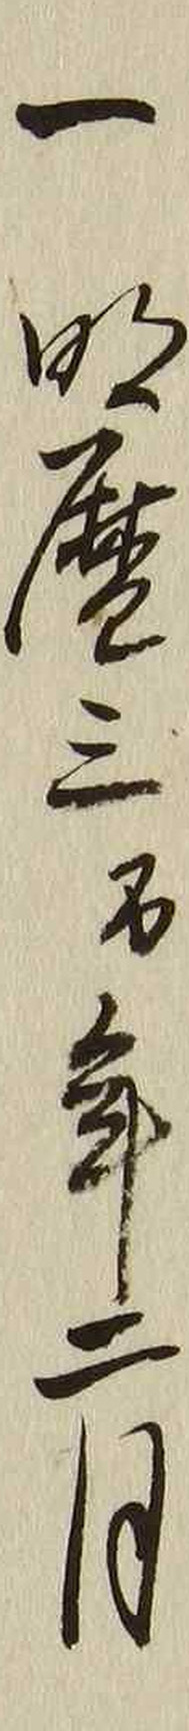一明暦三酉年二月
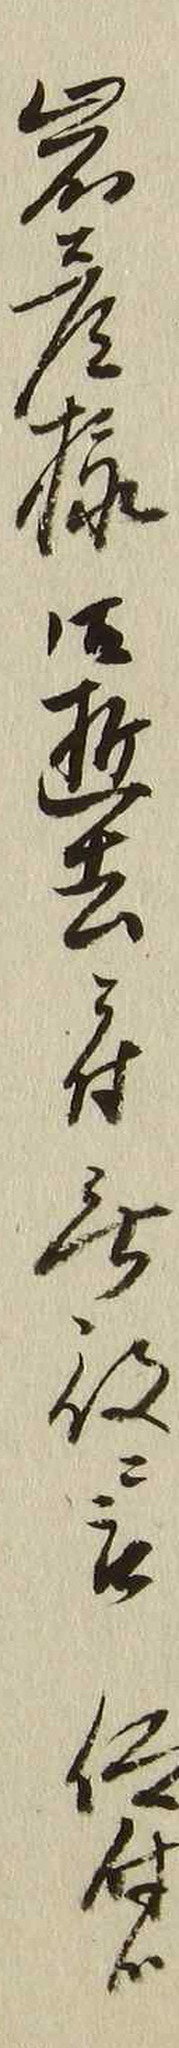岩彦様御逝去ニ付無役ニ被仰付候
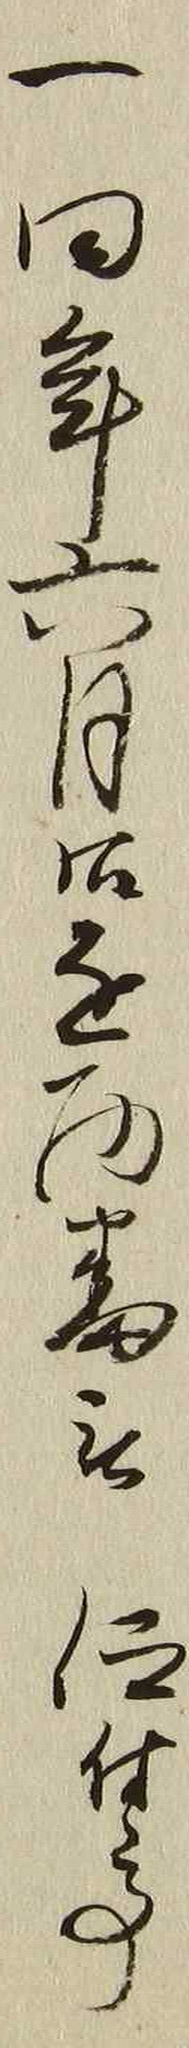一同年六月御進物番被仰付候事
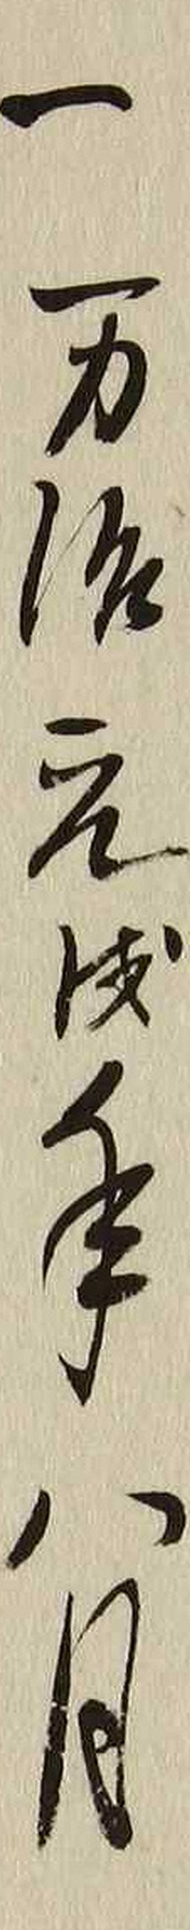一万治元戌年八月
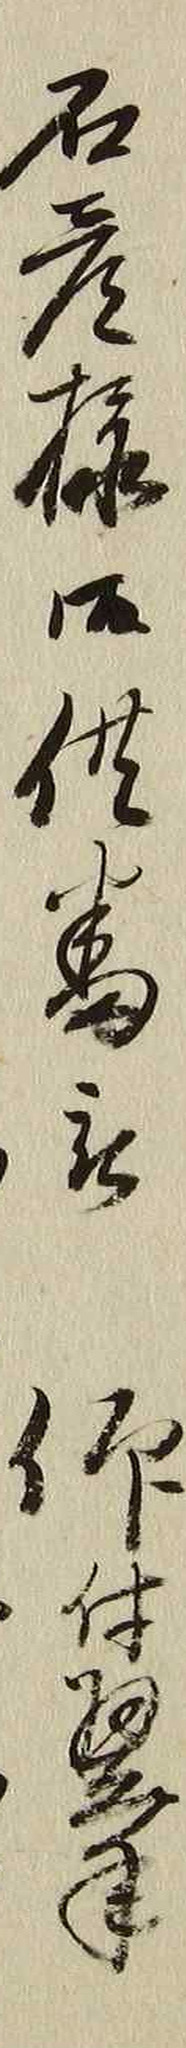石彦様御供番被仰付翌年
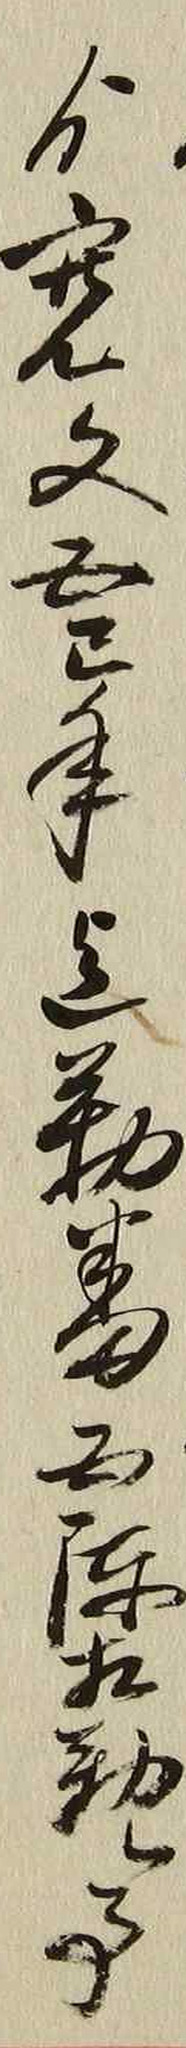ゟ寛文五巳年迄勤番五陣相勤候事
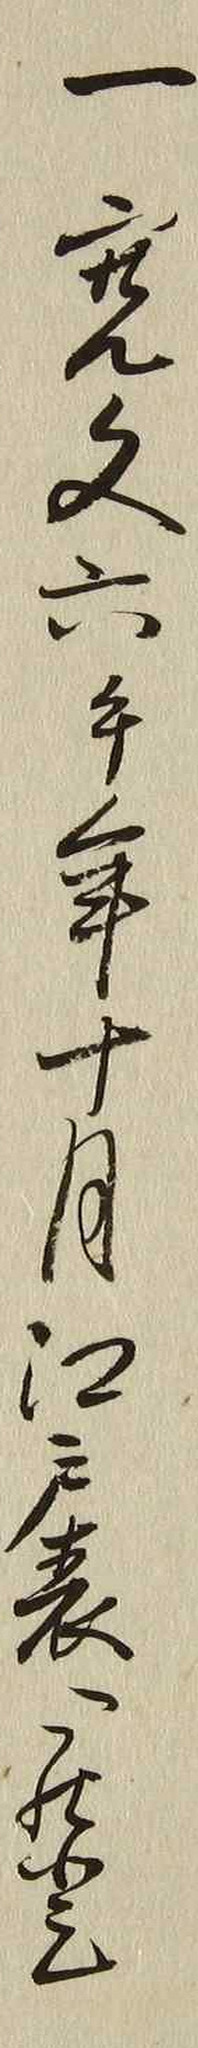一寛文六午年十月江戸表へ罷登
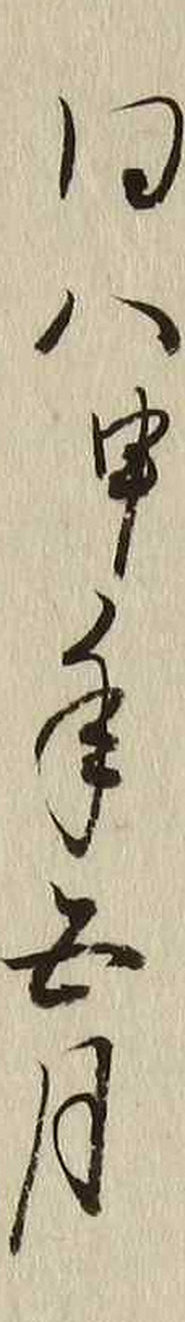同八申年五月
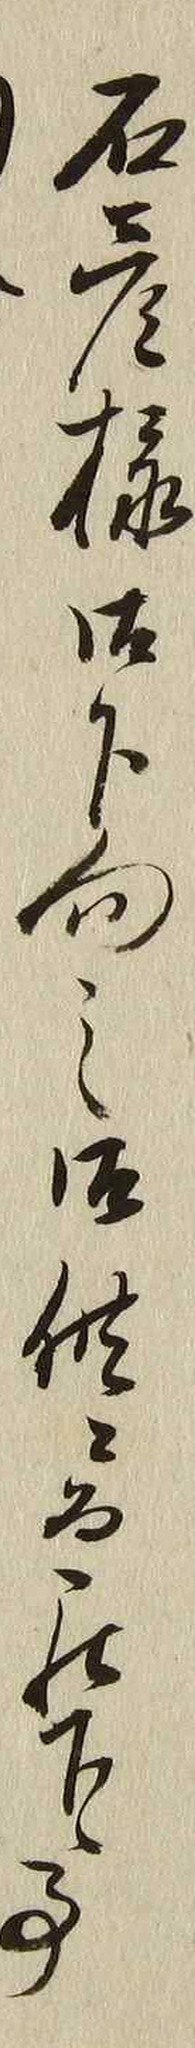石彦様御下向之御供ニ而罷下候事
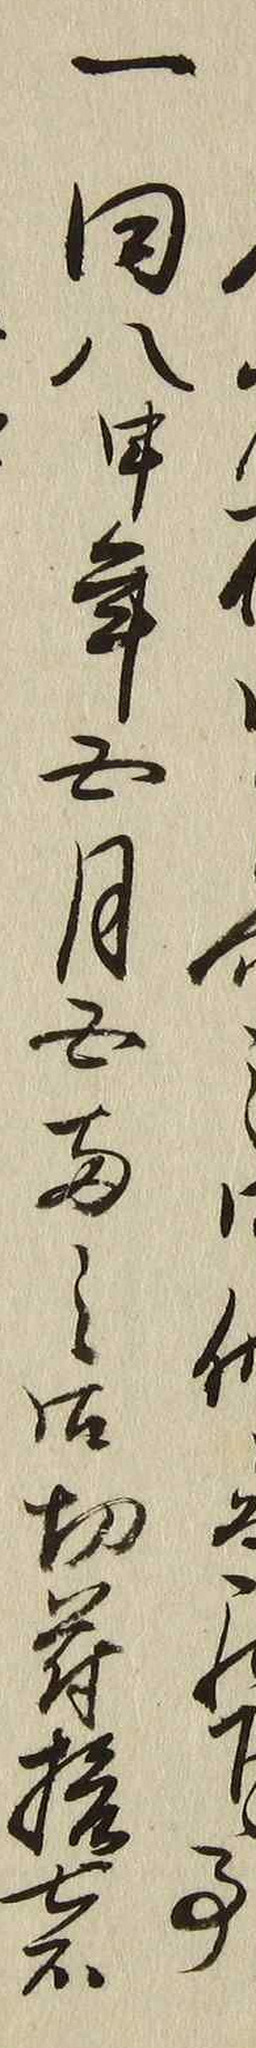一同八申年五月五両之御切符拾七石
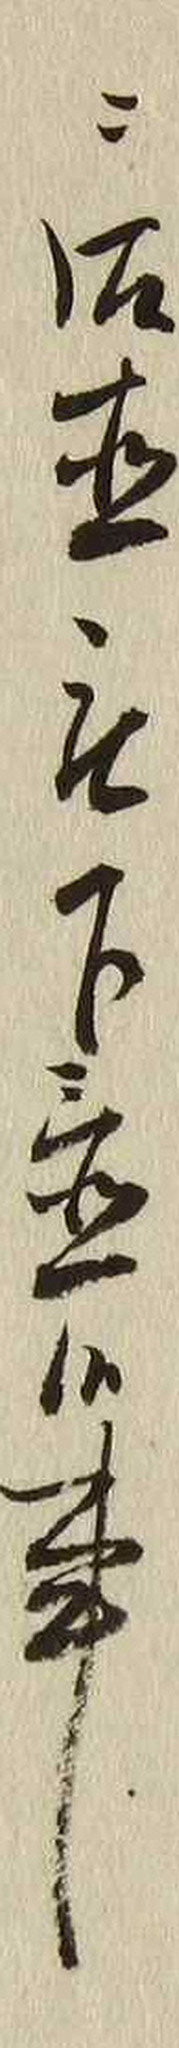ニ御直被下置候事
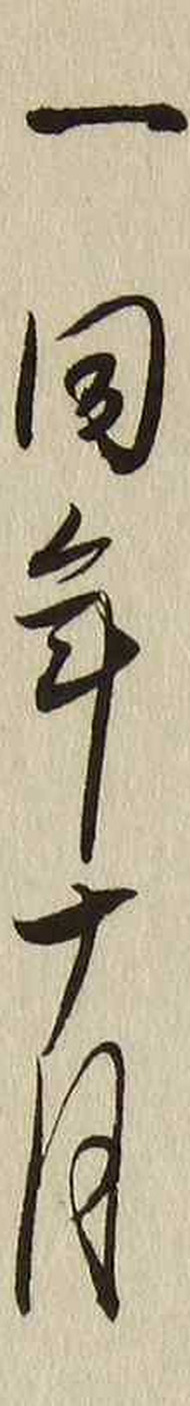一同年十月
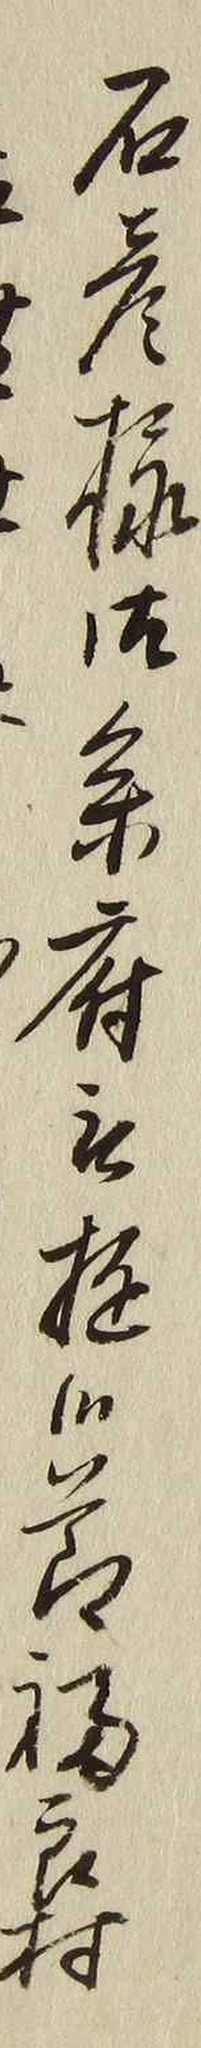石彦様御参府被遊候節福良村
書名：諸士系譜　巻之348　も之部4
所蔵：会津若松市立会津図書館
